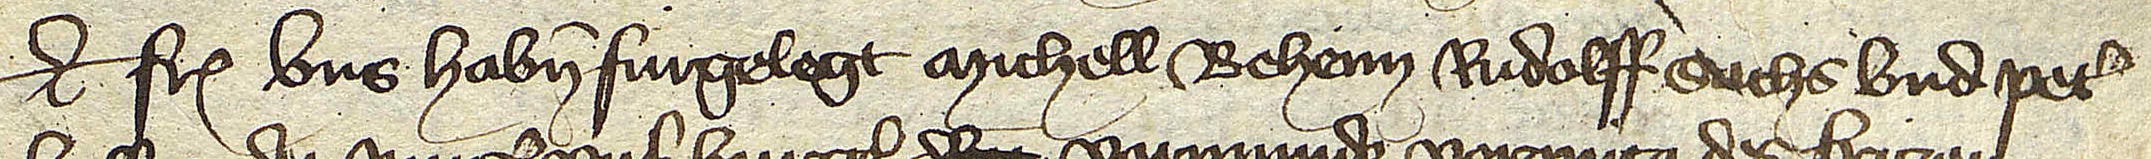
L* fr* vns habn* fürgelegt Michell Beheim Rudolff Sachs vnd pet*
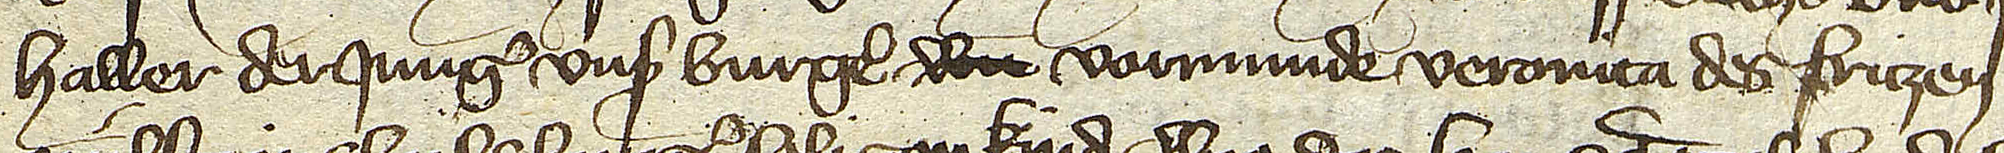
haller der Iung* vnſ* burge* / wie vormunde veronica des fricʒen
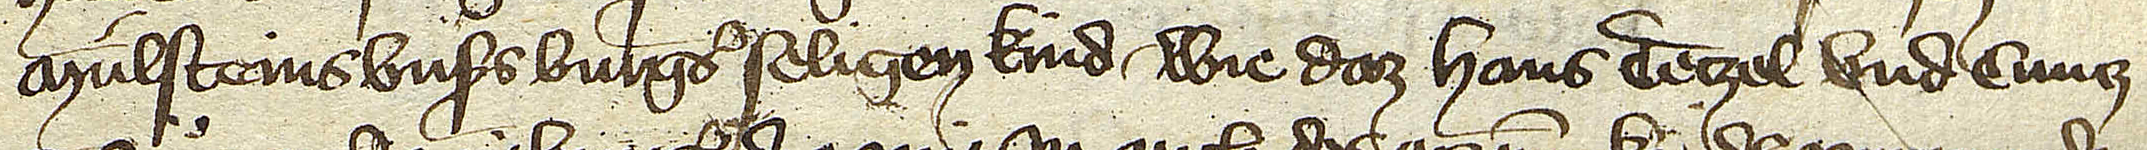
Mülſteins vnſ*s burgs* ſeligen kind / wie daʒ Hans Tecʒel vnd Cuncʒ
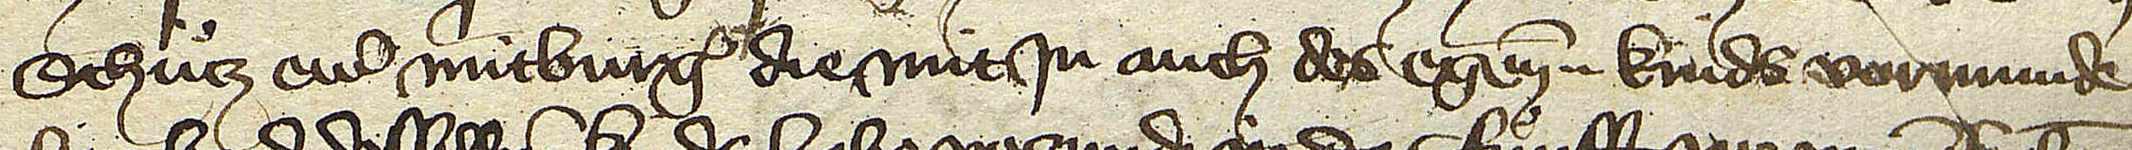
Schücʒ ew* mitburg* die mit In auch des egen* ~ kinds vormunde
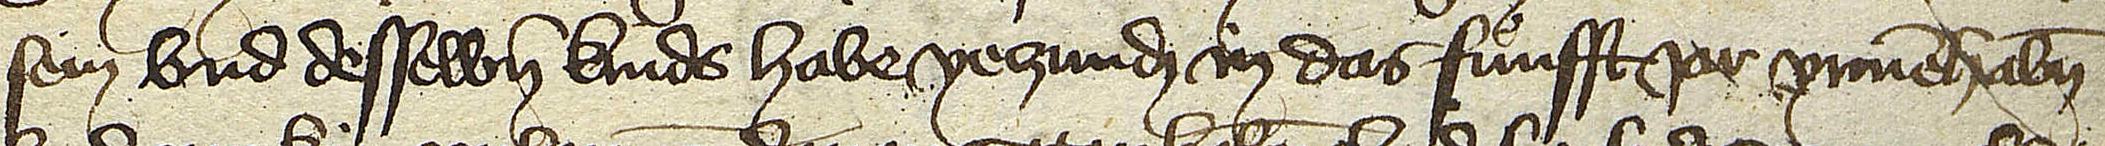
ſein vnd deſſelbn* kinds habe yecʒund* in das fünfft Iar ynne*habn*
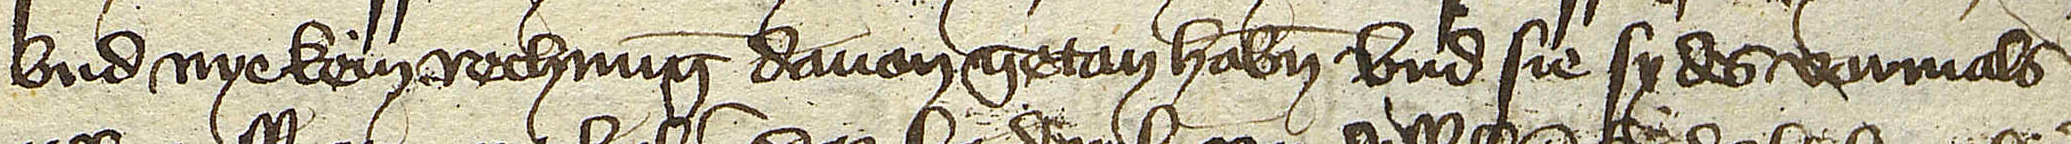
vnd nye kein rechnug* dauon getan habn* / vnd ſie ſy des vormals
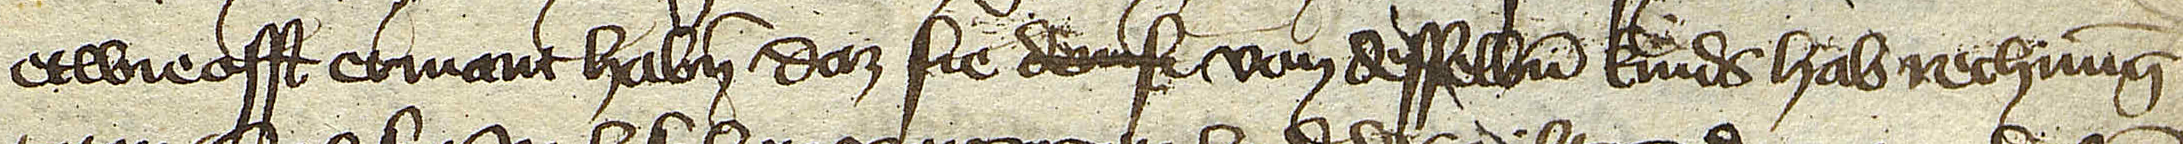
etwieofft ermant habn* / daʒ ſie demſe von deſſelbn* kinds hab rechnug*
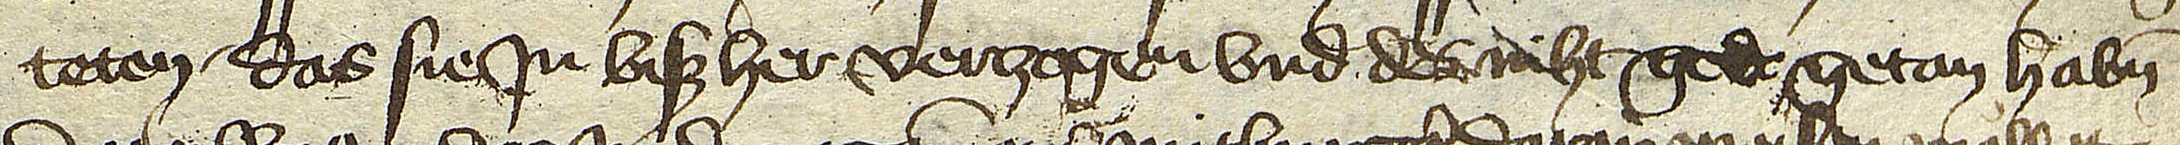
teten / das ſie In biſʒher vercʒogen vnd des niht ged getan habn*
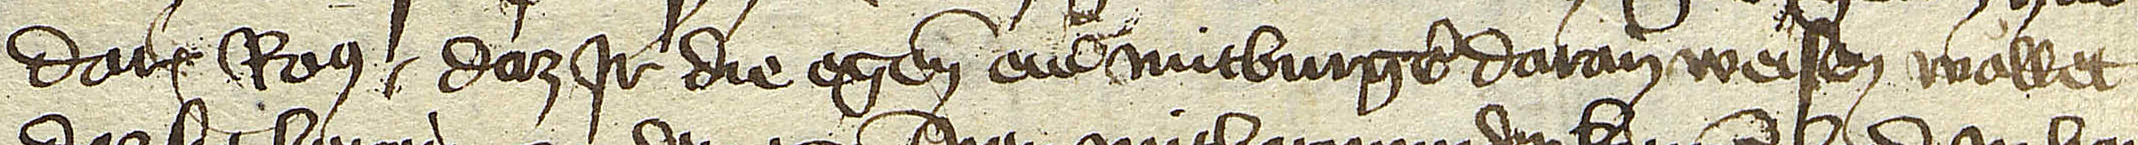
dar* Ro* / daʒ Ir die egen* ew* mitburge* daran weiſen wöllet
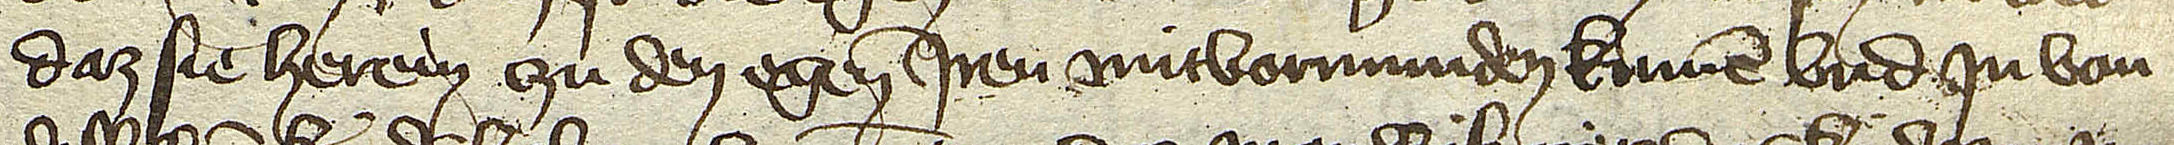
daʒ ſie herein cʒu den egen* Iren mitvormunden kume* vnd In von
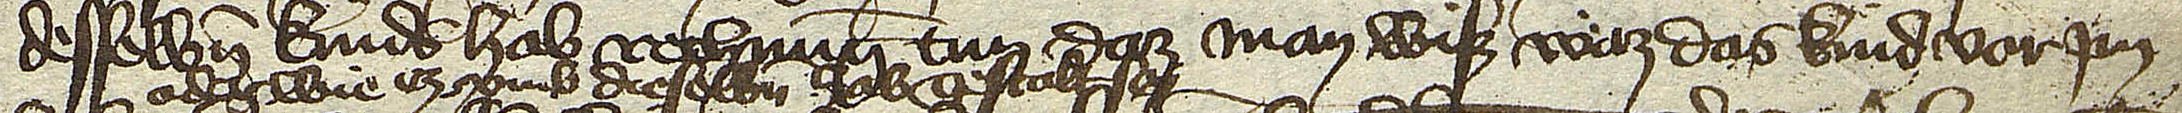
deſſelbn* kinds hab rechnug* tun / daʒ man wiſʒ waʒ das kind vor Im
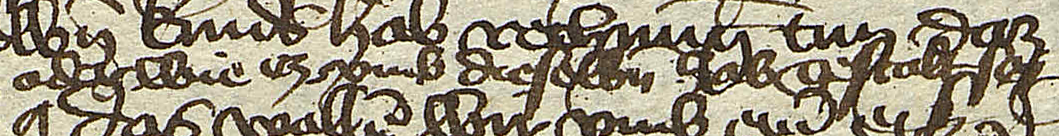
oder wie eʒ vmb dieſelbn* hab geſtalt ſey
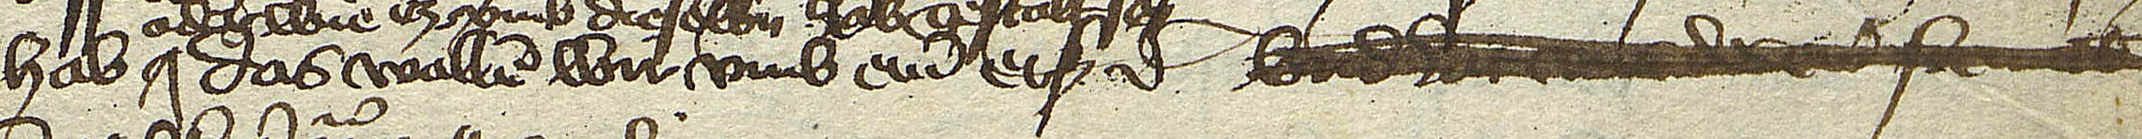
hab / das wolle* wir vmb ew* erſ* ec*/ vnd lat vns des ew* freuntl*
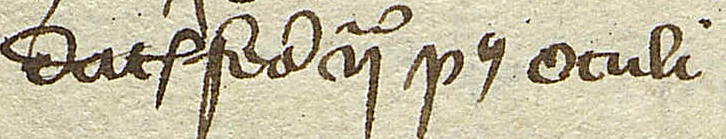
dat* fea* ii* p* Oculi
